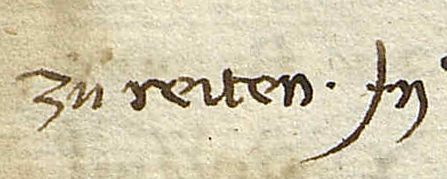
ʒu reiten . In
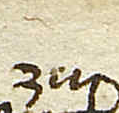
ʒu
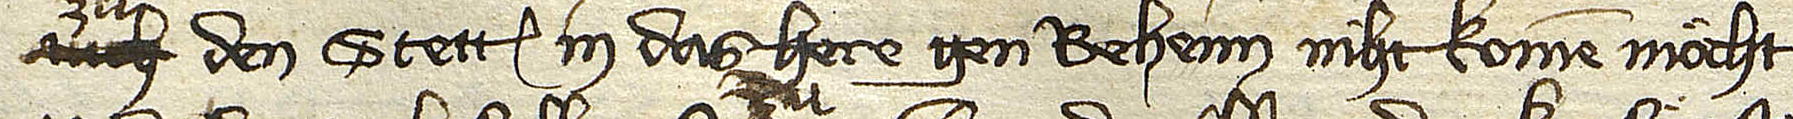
auch den Stett* in das here gen Beheim niht kome* möcht
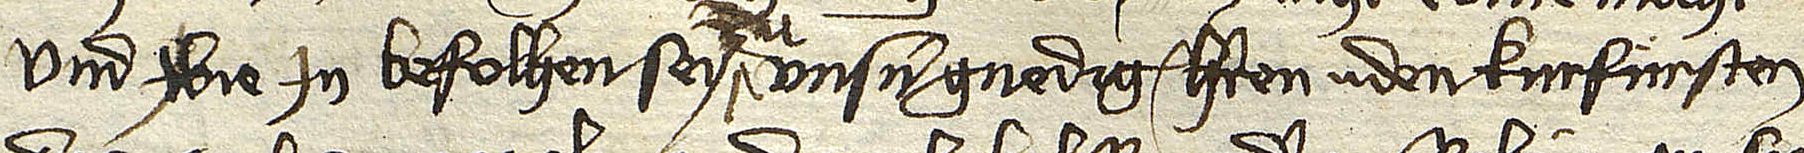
vnd wie In befolhen ſey vnſ*n gnedig* h*ren ~ den kurfürſten
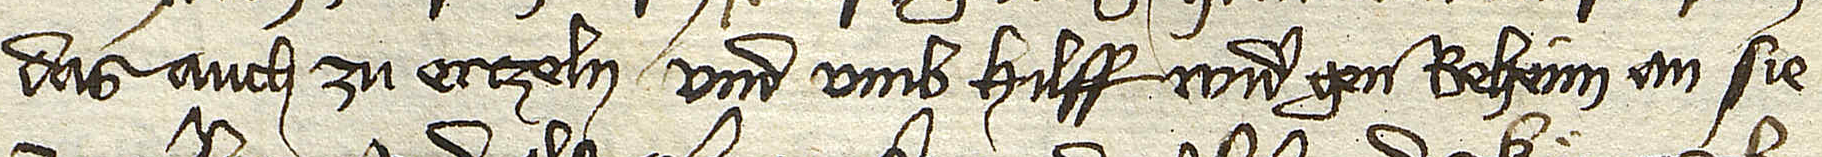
das auch ʒu ercʒeln vnd vmb hilff wid* gen Beheim an ſie
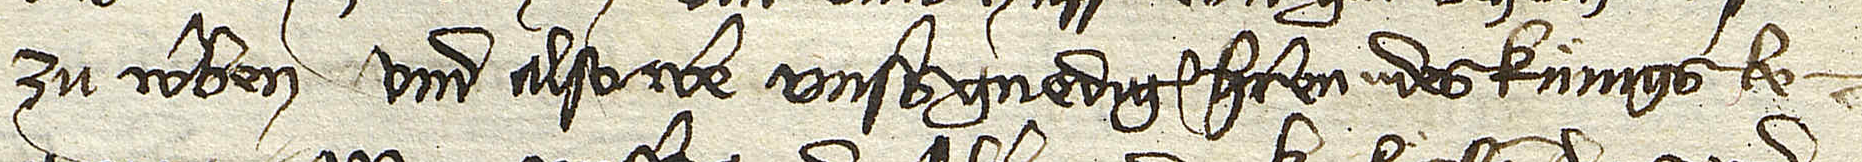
ʒu w*ben vnd alſo we* vnſ*s gnedig* h*ren ~ des künigs be =
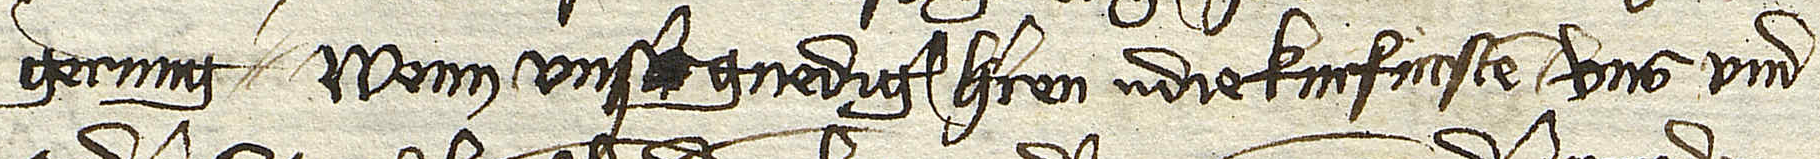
gerung // Wenn vnſ*n gnedig* h*ren ~ die kurfürſte* / Vns vnd
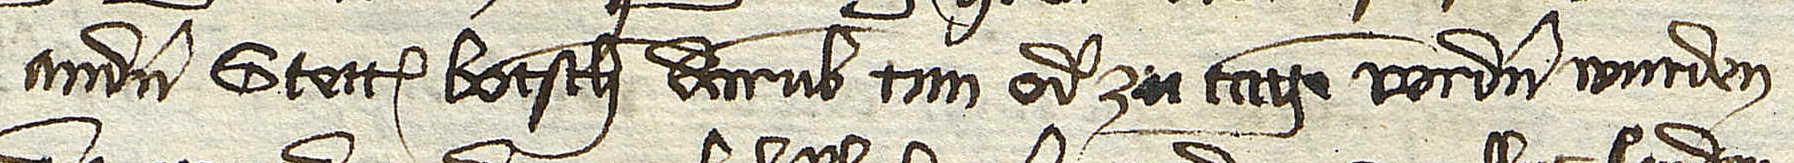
and*n Stett* botſch* daru*b tun od* ʒu tage* vord*n wurden
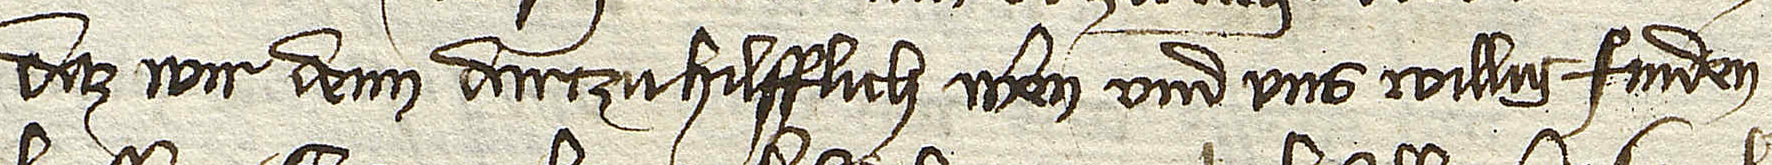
Daʒ wir denn darcʒu hilfflich we*n vnd vns willig finden
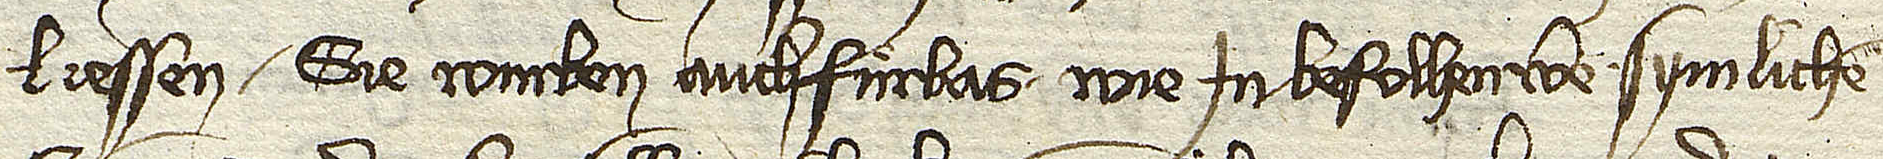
lieſſen / Sie wurben auch fürbas . wie In befolhen we* . ſymliche*
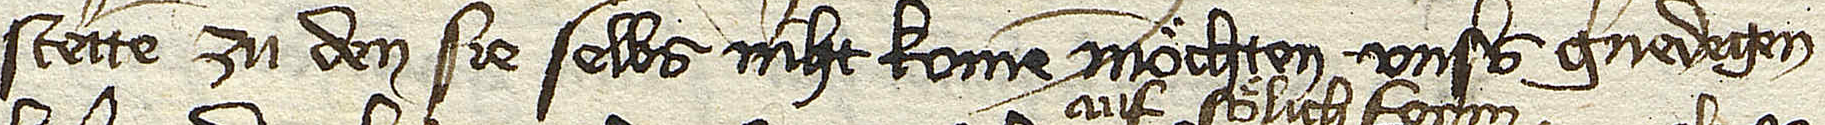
ſtette* ʒu den ſie ſelbs niht kome* möchten vnſ*s gnedigen
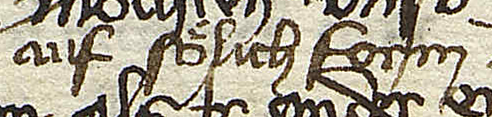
auf ſölich form
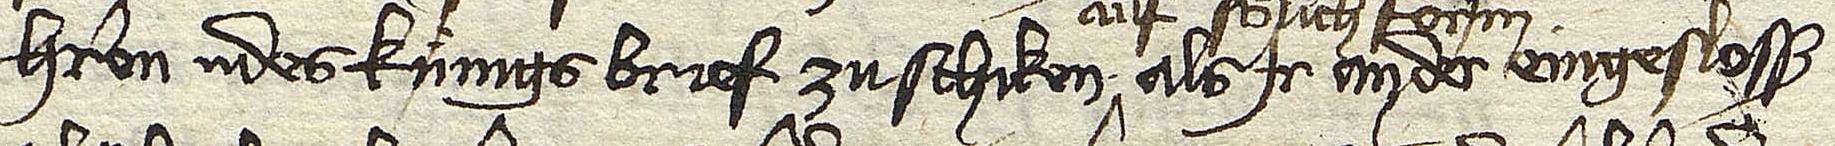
h*ren ~ des künigs brief ʒu ſchiken . als Ir an der eingeſloſſ*
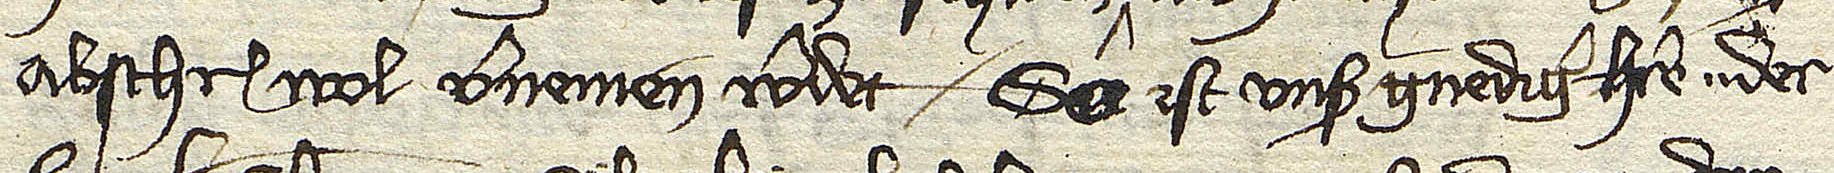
abſchr* wol v*nemen w*det / So iſt vnſ* gnedig* hre* ~ der
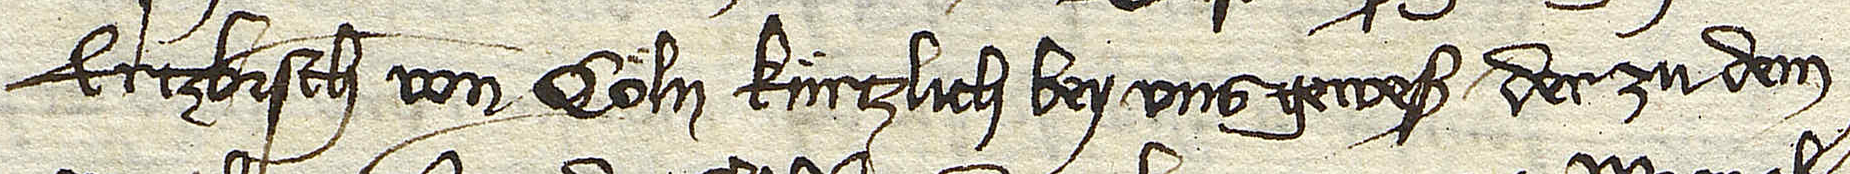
Ercʒbiſch* von Cöln kürcʒlich bey vns geweſ* / der ʒu dem
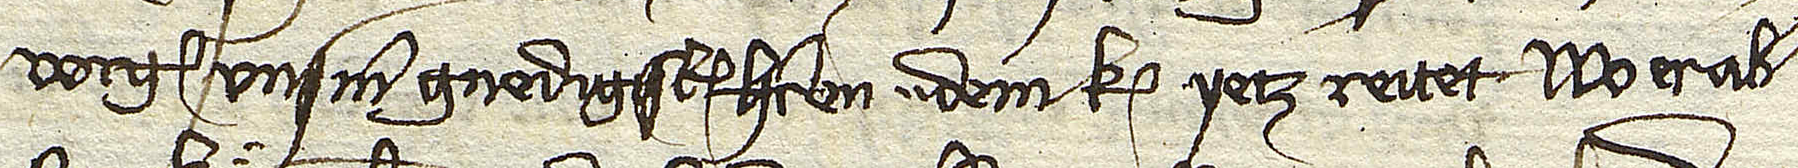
vorg* vnſ*m gnedigiſt* h*ren ~ dem k* yecʒ reitet . Wo er ab*
